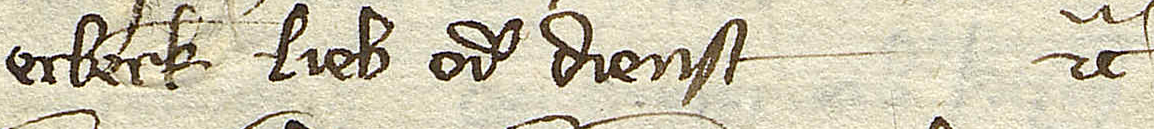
erberk* lieb od* dienſt ec*
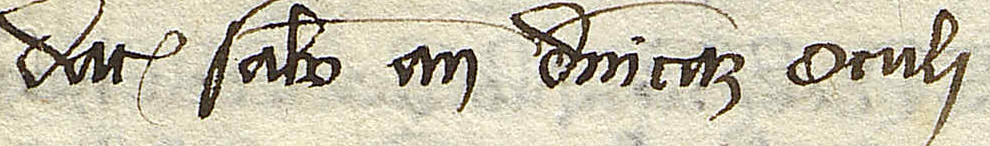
Dat* ſabo an* dnica* Oculi
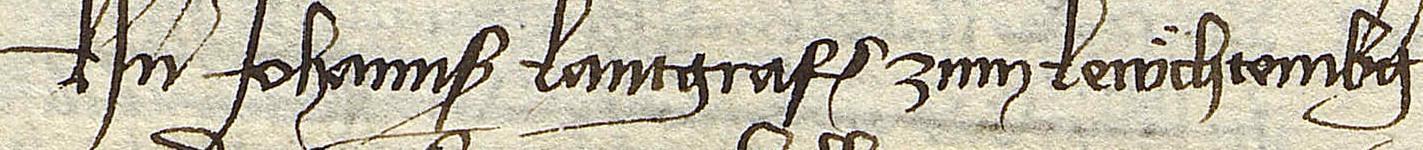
H*n Iohannſ* Lantgraf* ʒum Lewchtemb*g
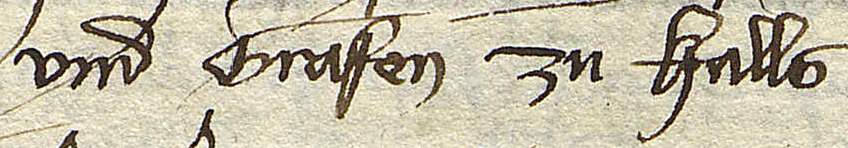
vnd Grafen ʒu Halls
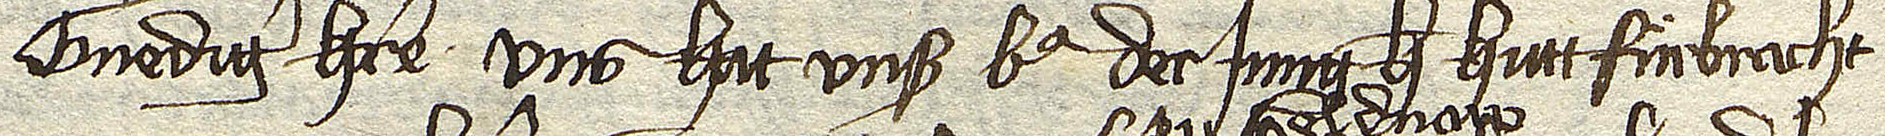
Gnedig* h*re . vns hat vnſ* b* Iung* H* Hutt fürbracht
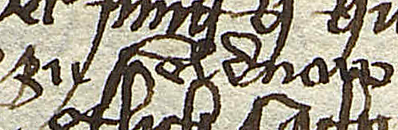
ʒu ſeldnaw
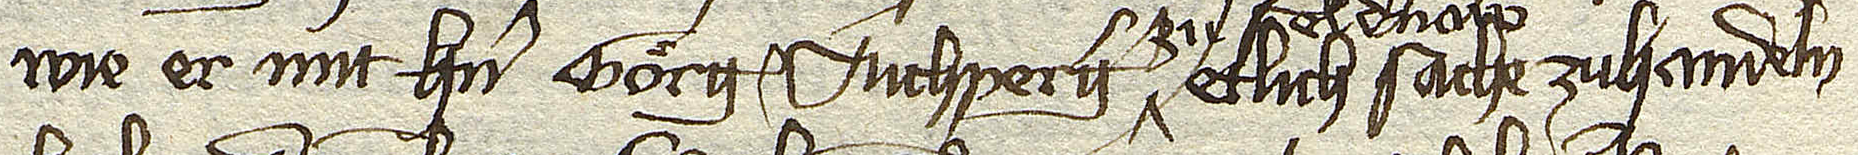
wie er mit h*n Görg Aichperg* etlich ſache ʒuhandeln
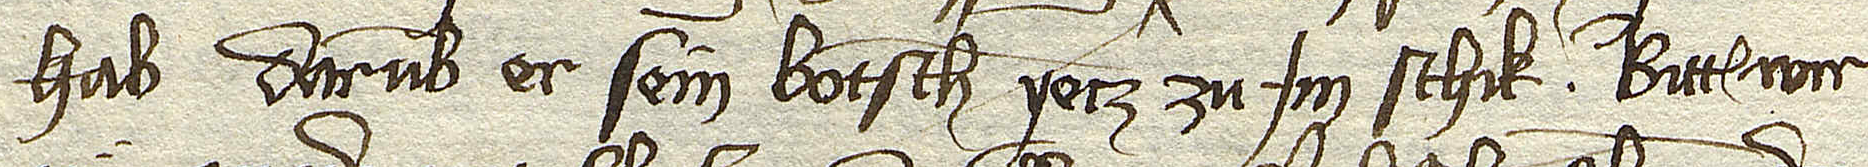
hab Daru*b er ſein botſch* yecʒ ʒu Im ſchik . Bitt* wir
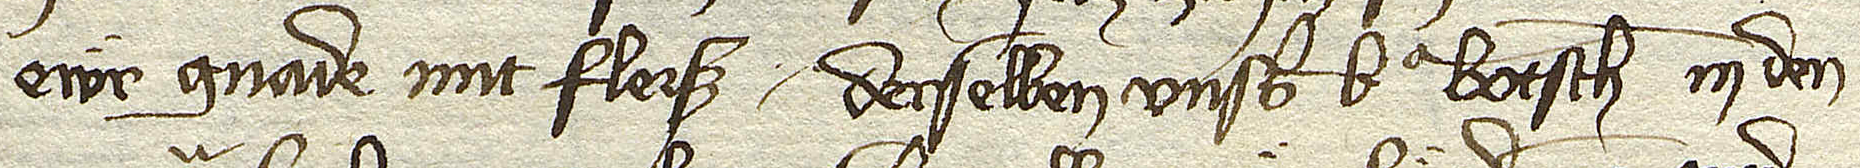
ewr gnade mit fleiſʒ / Derſelben vnſ*s b* botſch* in den
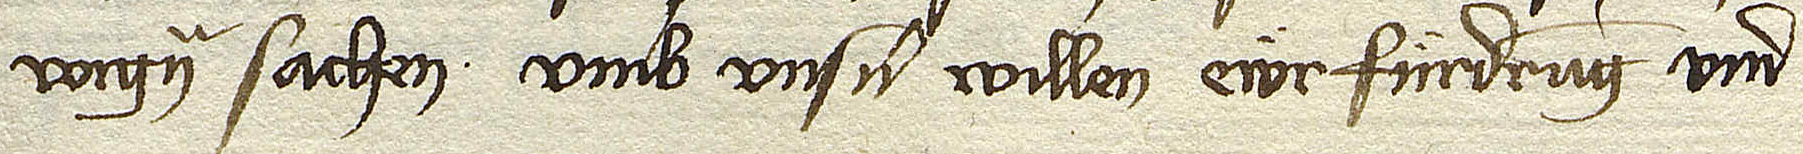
vorg*n ſachen . vmb vnſ*n willen ewr fürdru*g vnd
